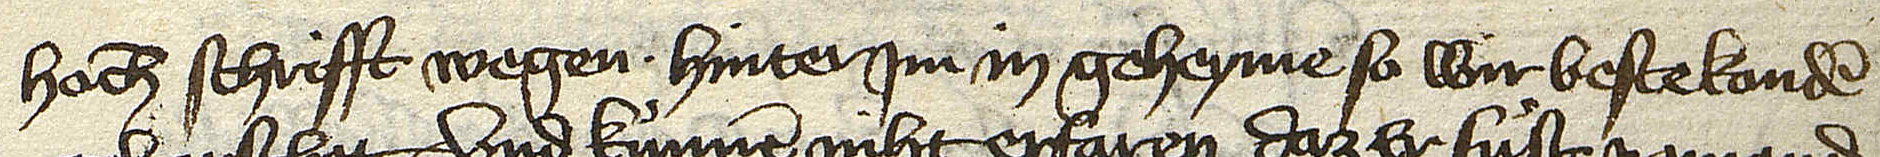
hoch* ſchrifft wegen . hinter Im in geheyme ſo wir beſte kond*
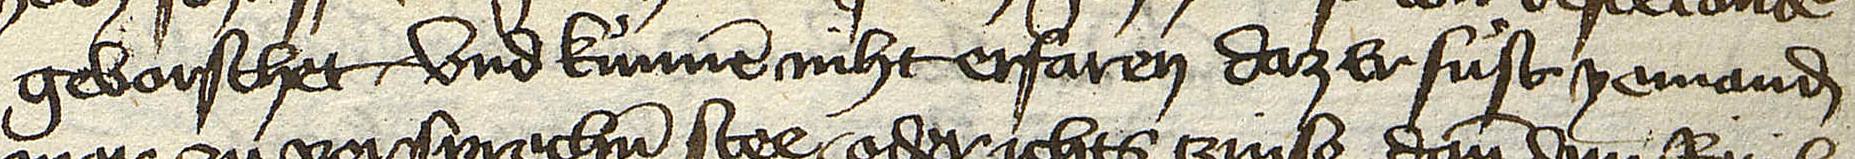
gevorſchet / vnd künne* niht erfaren daʒ Er ſüſt yemand*
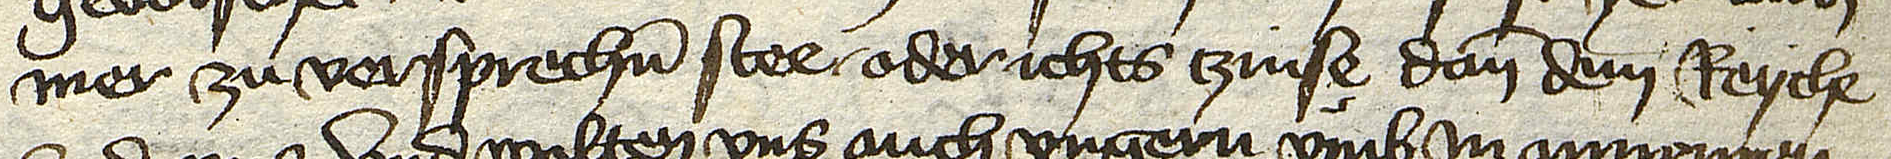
mer cʒu verſprechn* ſtee / oder ichts cʒinſe dan* dem Reyche
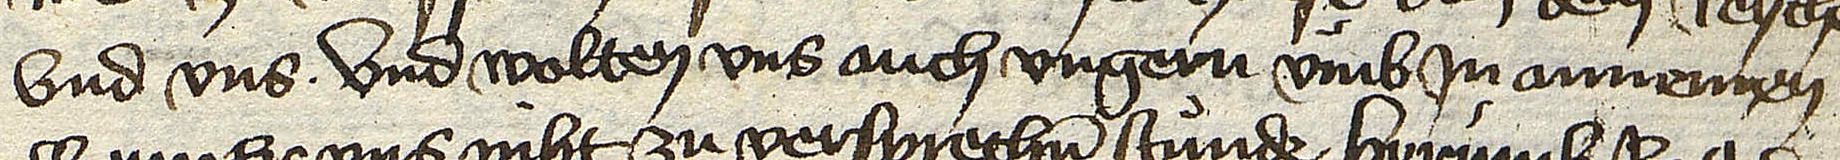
vnd vns . Vnd wolten vns auch vngern v̈mb In annemen
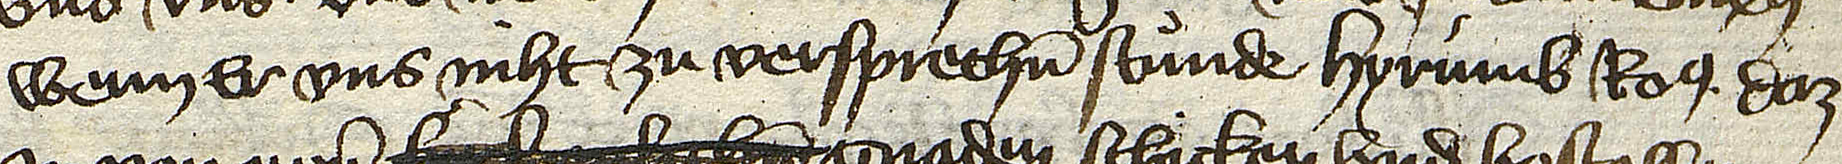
wenn Er vns niht cʒu verſprechn* ſtünde hyrümb Ro* . daʒ
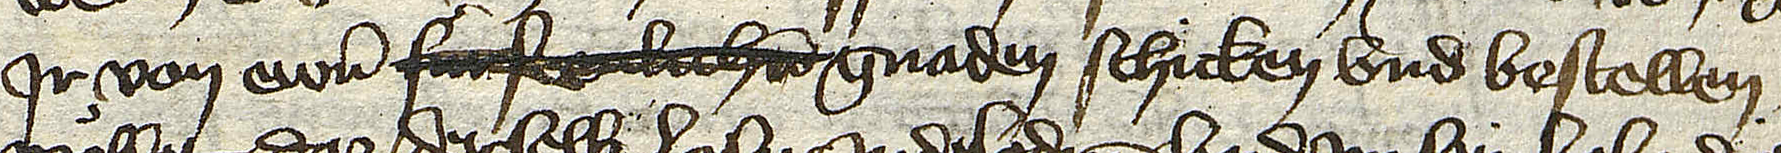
Ir von ewn* fürſtenlichn* gnaden ſchicken vnd beſtellen
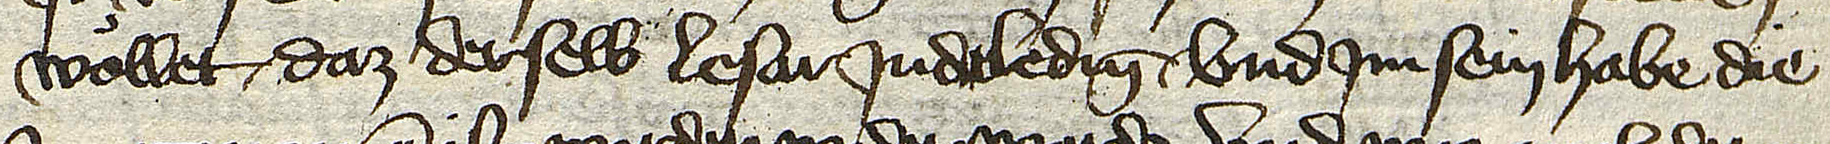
wöllet / daʒ derſelb leſar Iude ledig / vnd Im ſein habe die
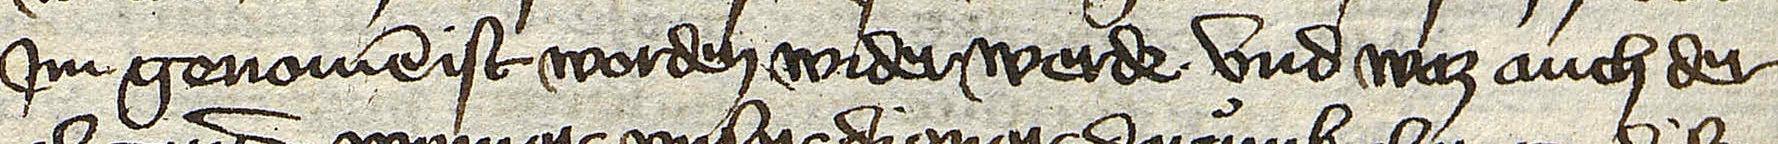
Im genome* iſt worden wider werde . vnd waʒ auch der
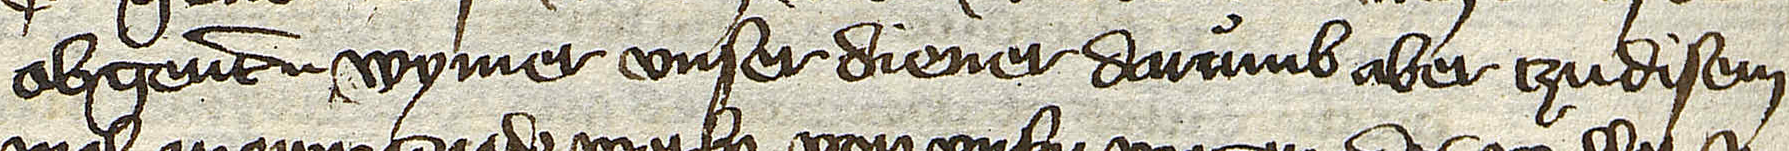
obgent* ~ wymer vnſer diener darümb aber cʒu diſem
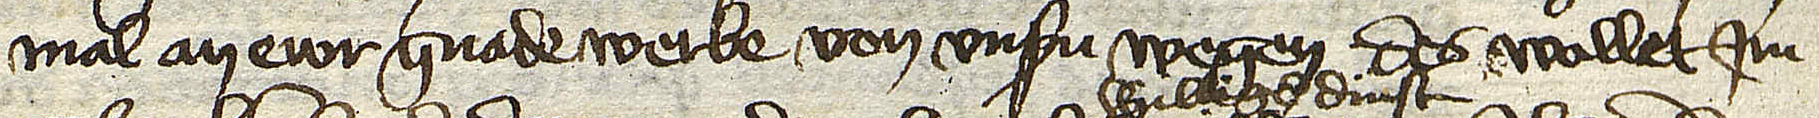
mal an ewr gnade werbe von vnſ*n wegen des wöllet Im
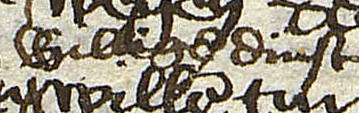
willige* dinſt
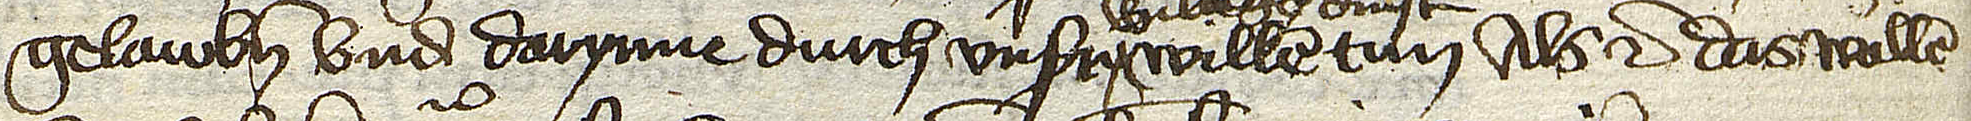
gelawbn* vnd darynne durch vnſ*n wille* tun Als ec* das wölle*
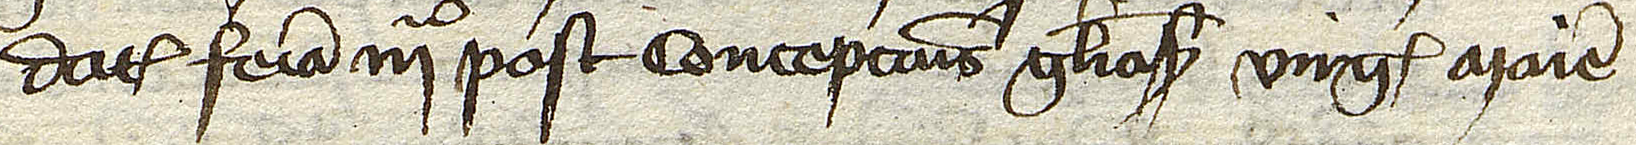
dat* feia* iii* poſt Concepcois* glioſ* virg* Maie*
